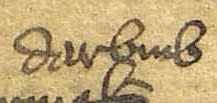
darvmb
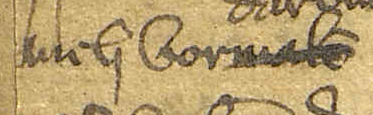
auch vormals
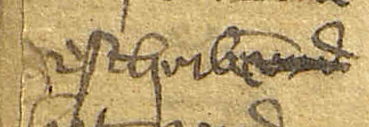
geſchrib* vnd
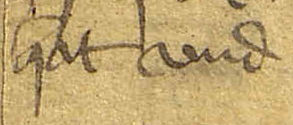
hat vnd
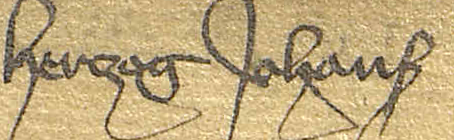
hercʒog Iohanſ*
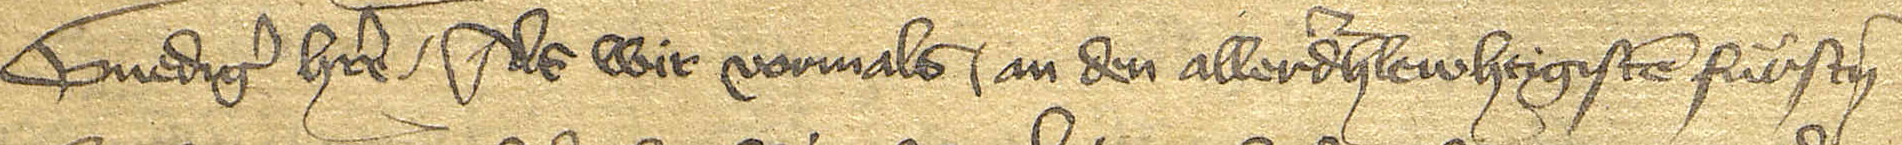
Gnedig* hr*e / Als wir vormals / an den allerd*hlewhtigiſte* fürſtn*
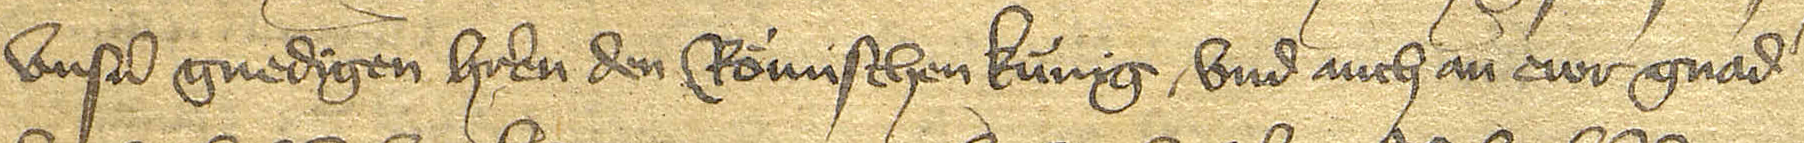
vnſn* gnedigen hr*en den Römiſchen künig / vnd auch an ewr gnad
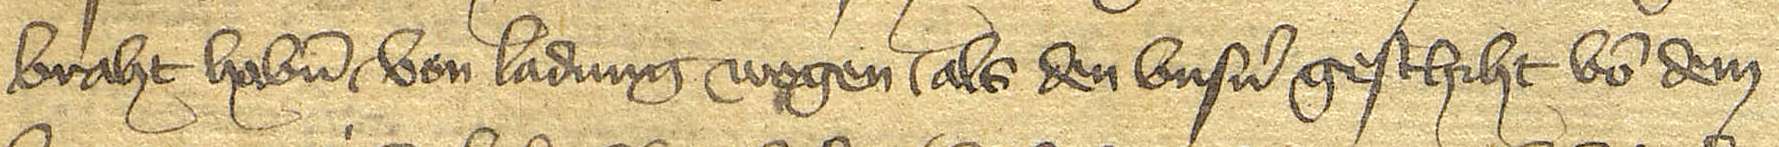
braht habn* / von ladung wegen / als den vnſn* geſchiht vo* dem
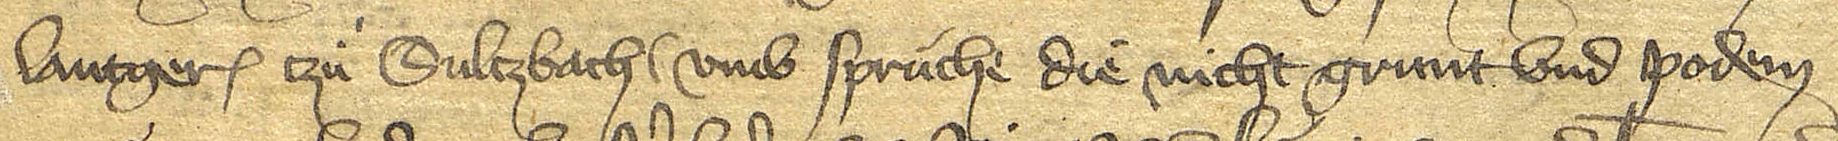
lantger* cʒü Sulcʒbach / vmb ſprüche die nicht grunt vnd podem
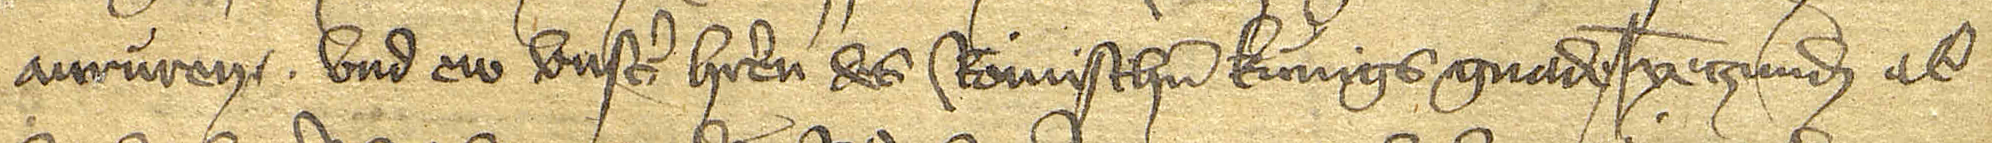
anrüren / . vnd ew vnſs* hr*en des Römiſchn* künigs gnade yecʒund* ab*
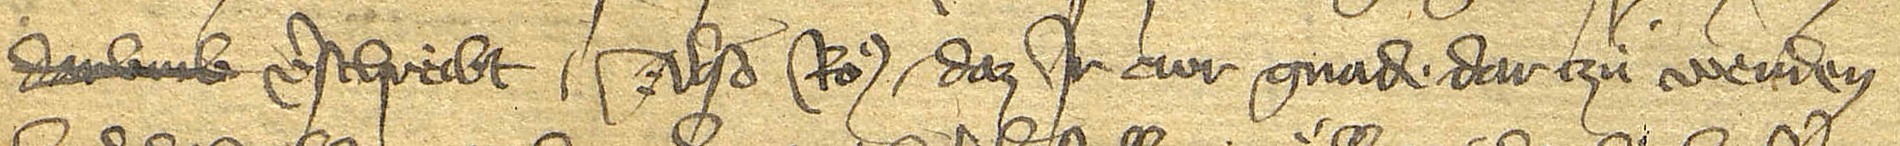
darvmb v*ſchreibt / Alſo Ro* / daʒ Ir ewr gnade dar cʒü wenden
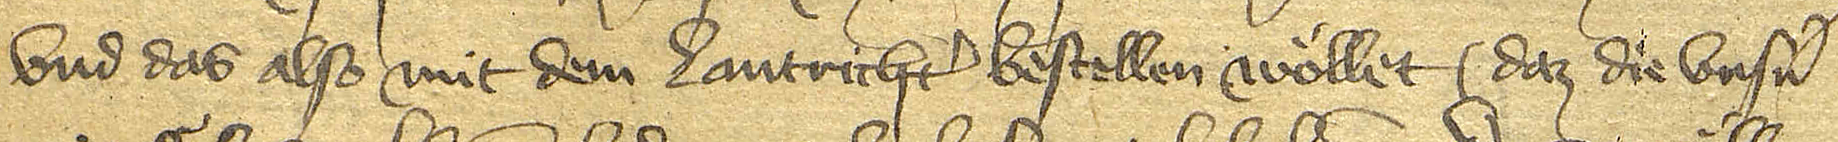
vnd das alſo mit dem Lantricht* beſtellen wöllet / daʒ die vnſn*
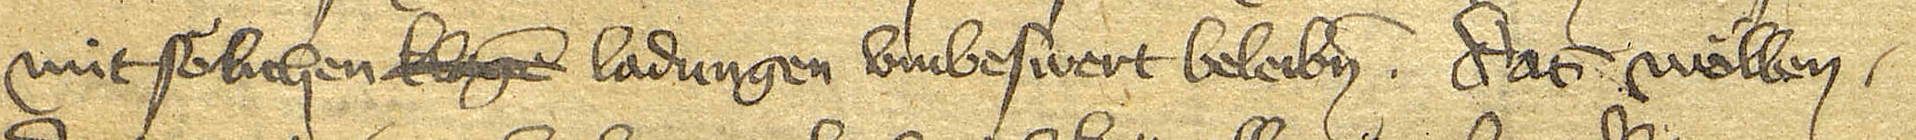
mit ſölichen klage* ladungen vmbeſwert beleibn* . Das wöllen /
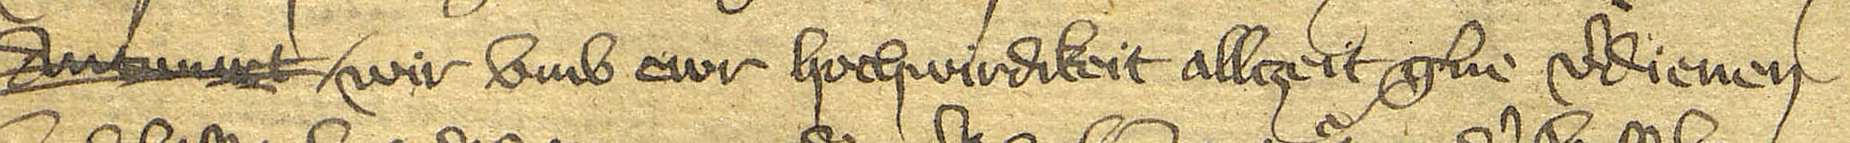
Antwurt / wir vmb ewr hochwirdikeit allcʒeit g*ne v*dienen
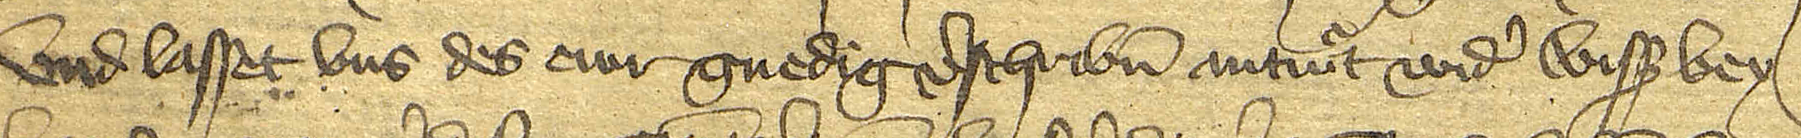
vnd laſſet vns des ewr gnedig v*ſchribn* antw*t wid* wiſſ* bey
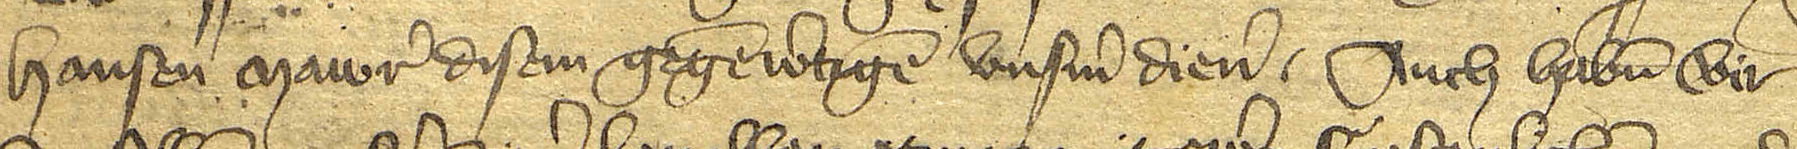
hanſen Mawr* diſem gege*w*tige* vnſm* dien* / Auch habn* wir
